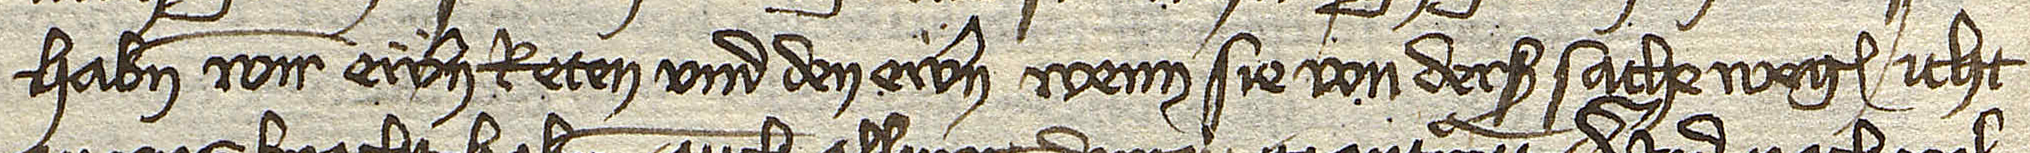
habn* wir eẅ*n Reten vnd den eẅ*n wenn ſie von derſ* ſache weg* icht
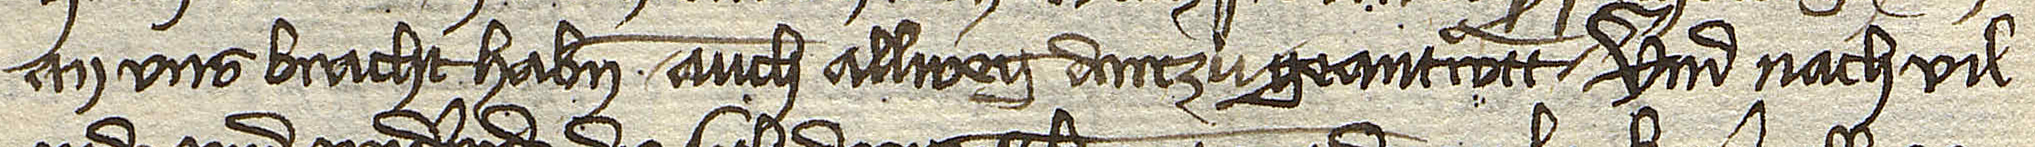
an vns bracht habn* / auch allweg darcʒu geantw*tt / Vnd nach vil
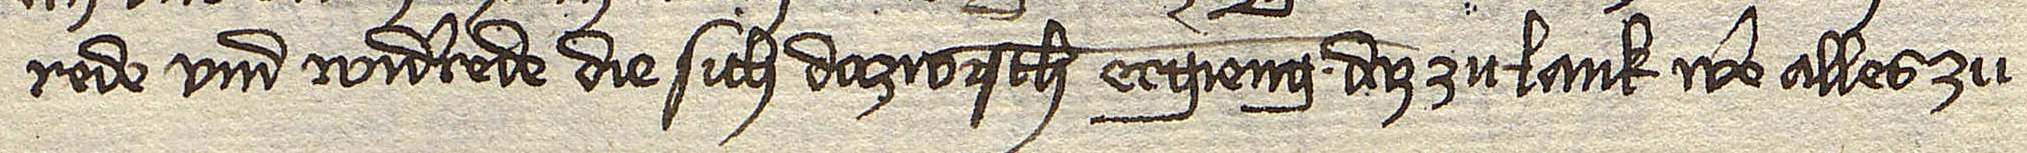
rede vnd wid*rede die ſich daʒwiſch* ergieng . daʒ ʒu lank w*e alles ʒu
